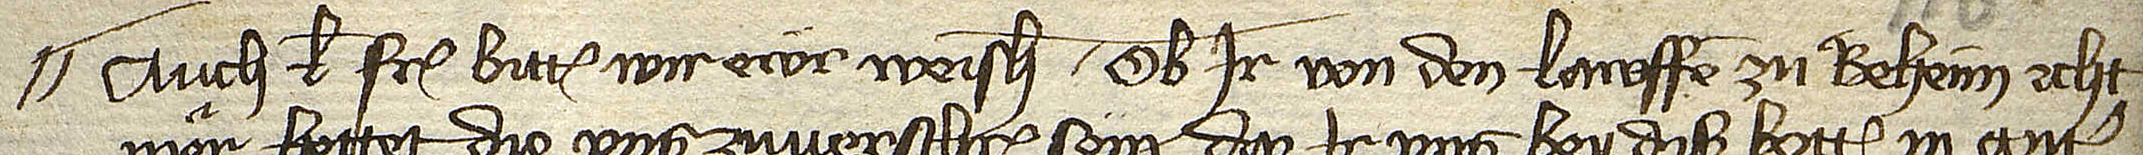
Auch L* fr* bitt* wir eẅr weiſh* / Ob Ir von den lawffe* ʒu Beheim icht
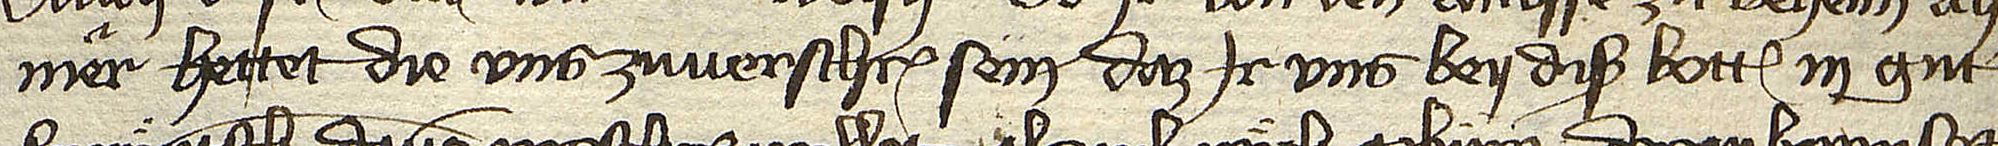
mër hettet die vns ʒuuerſchr* ſein daʒ Ir vns bey diſ* bott* in gut*
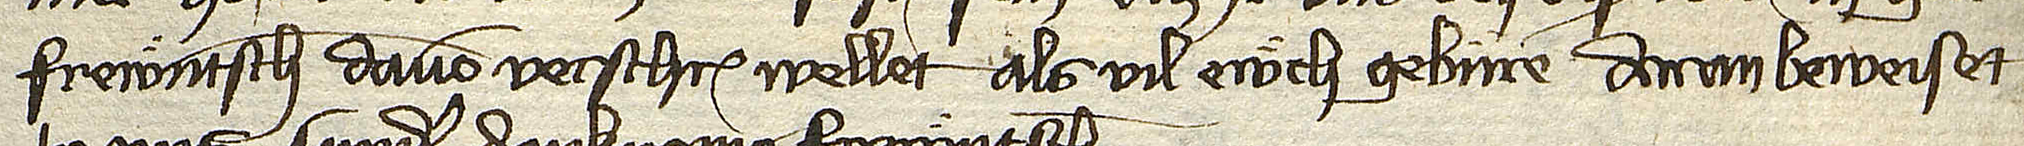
freẅntſch* dauo* verſchr* wellet als vil eẅch gebüre daran beweiſet
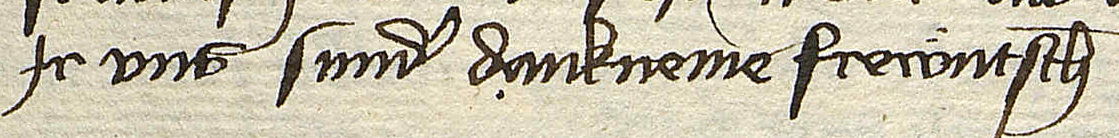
Ir vns ſund* dankneme freẅntſch*
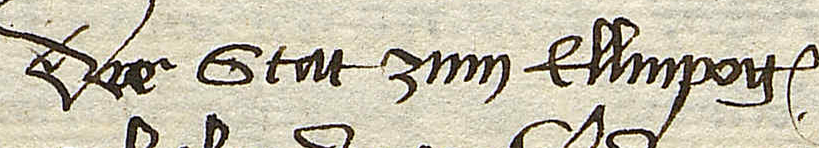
Der Stat ʒum Ellmpog*
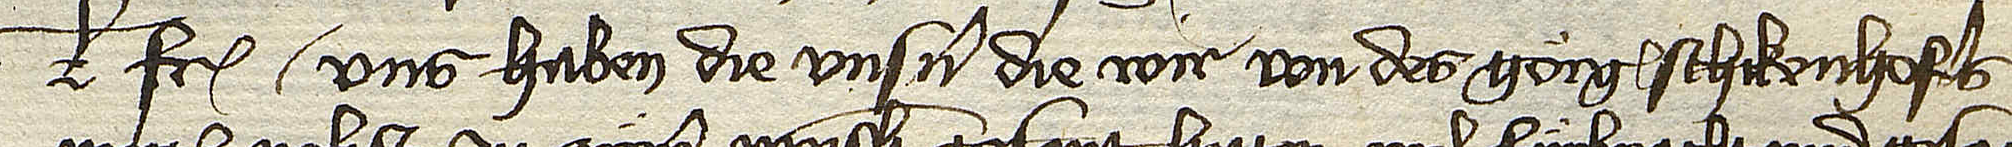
L* fr* / vnd haben die vnſn* die wir von des görg* ſchikenhof*s
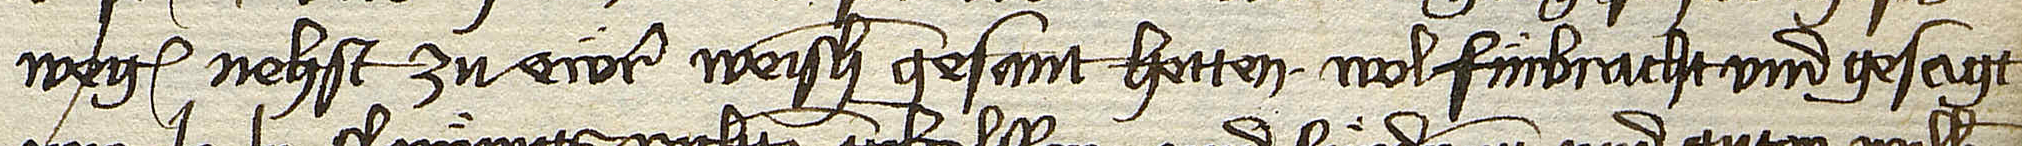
weg* nehſt ʒu eẅr* weiſh* geſant hetten / wol fürbracht vnd geſagt
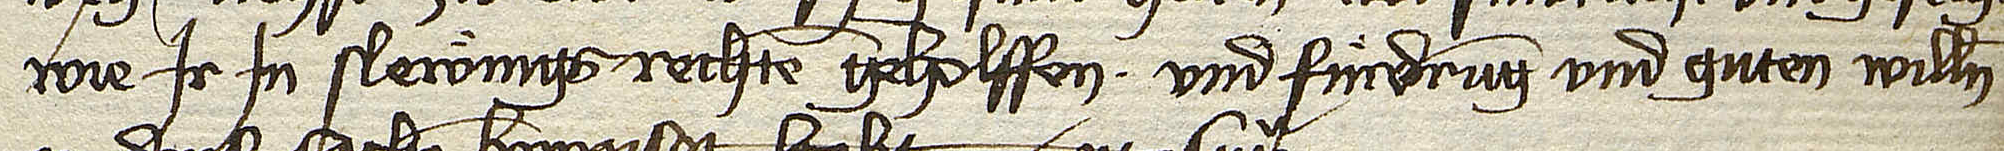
wie Ir In ſleẅnigs rechte* geholffen . vnd fürdru*g vnd guten willn*
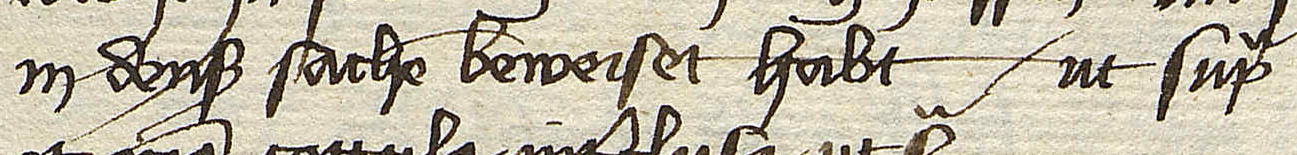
in denſ* ſache* beweiſet habt / ut ſup*
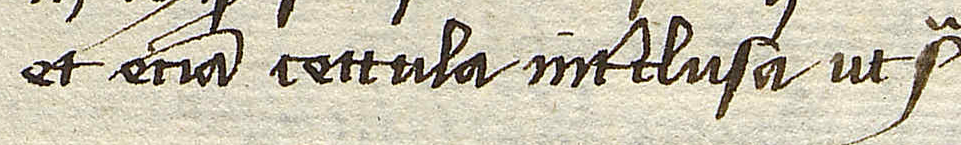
et ecia* cettula int*cluſa ut ſ*
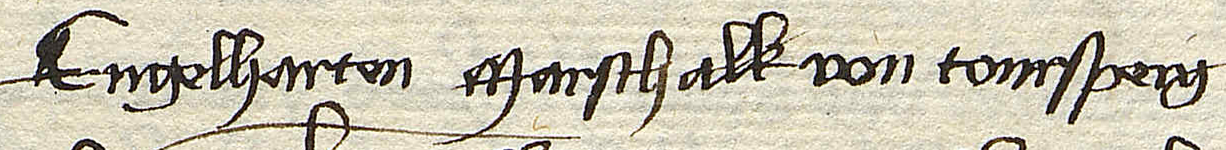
Engelharten Marſchalk von tonrſperg
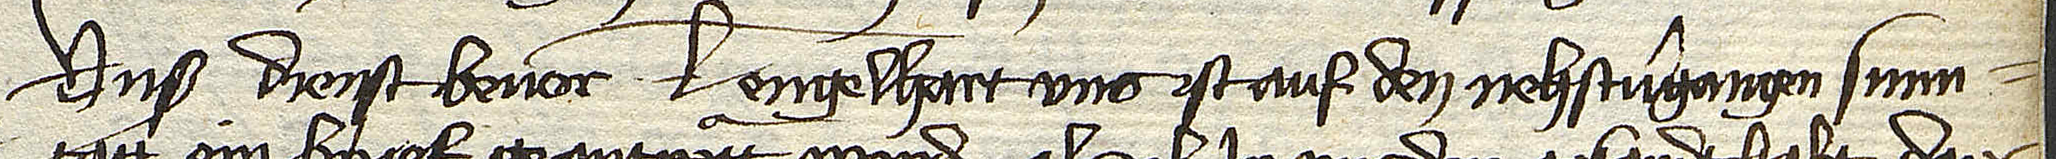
Vnſ* dienſt beuor* L* engelhart vns iſt auf den nehſtu*gangen ſunn =
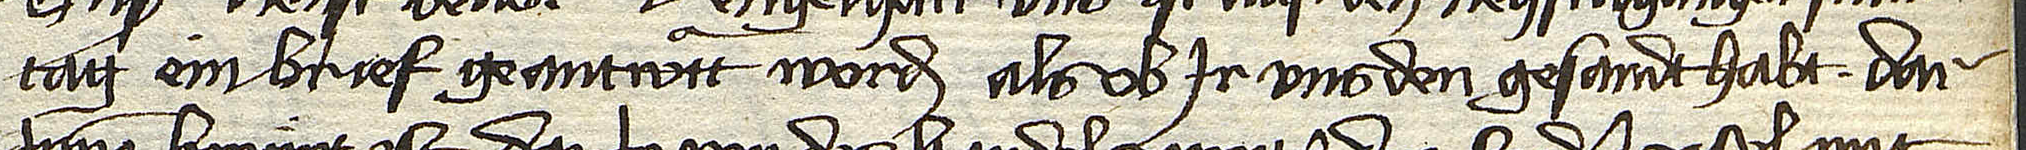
tag ein brief geantw*tt word* als ob Ir vns den geſandt habt . Dar
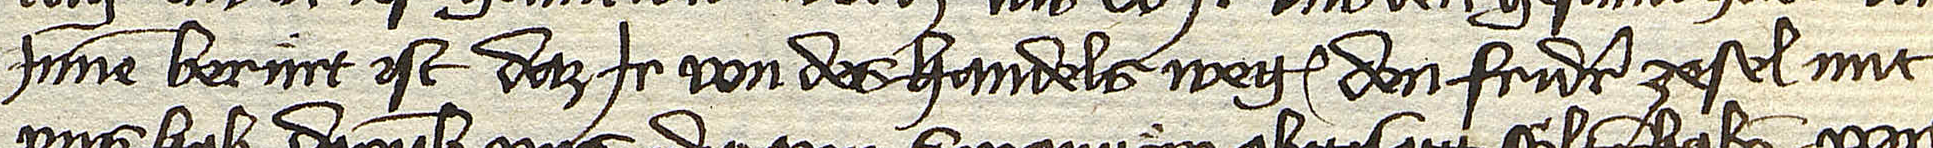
Inne* berürt iſt daʒ Ir von des handels weg* den fridr* ʒeſel mit
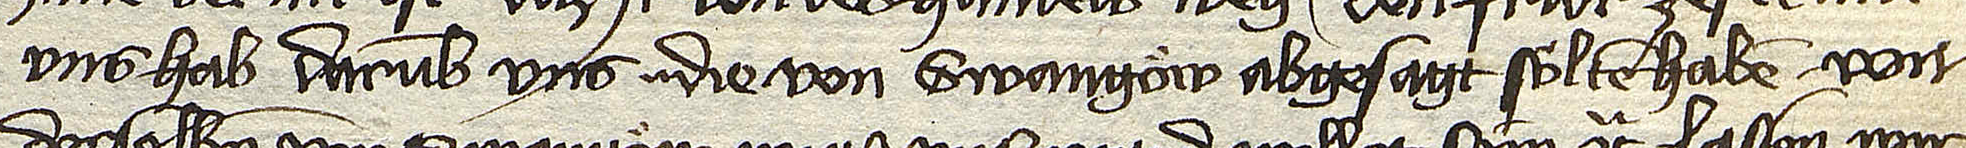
vns hab darub* vns ~ die von Swangöw abgeſagt ſölte* habe* / von
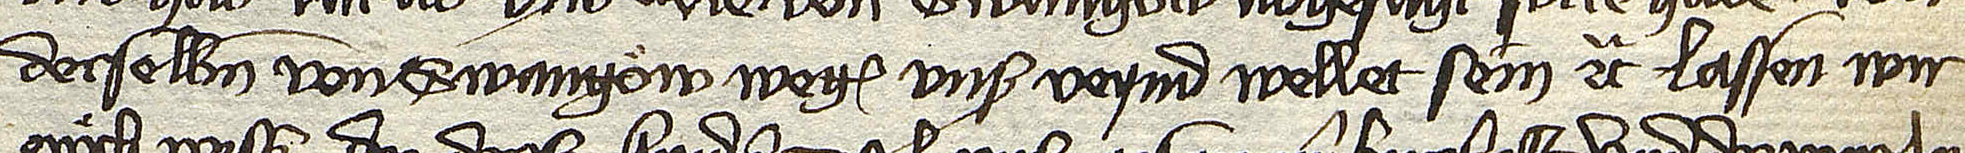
derſelbn* von Swangöw weg* vnſ* veynd wellet ſein ec* laſſen wir
